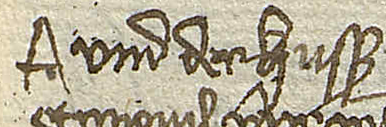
vnd der huſſ*
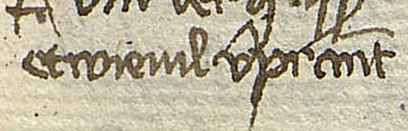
etwieuil v*prant*
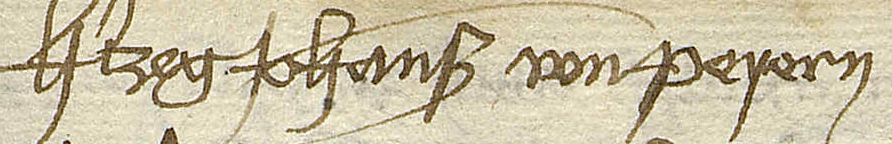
H*cʒog* Iohanſ* von Peyern
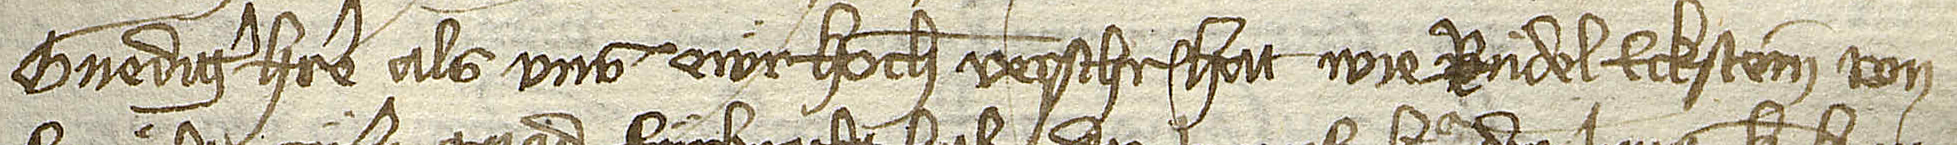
Gnedig* hre* als vns ewr hoch* verſchr* hat wie Rüdel Eckſtein von
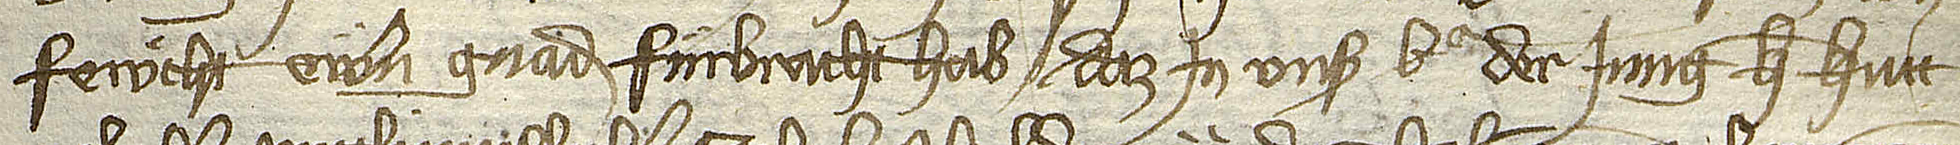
fewcht ew*n gnad* fürbracht hab / daʒ In vnſ* b* der Iung H* Hutt
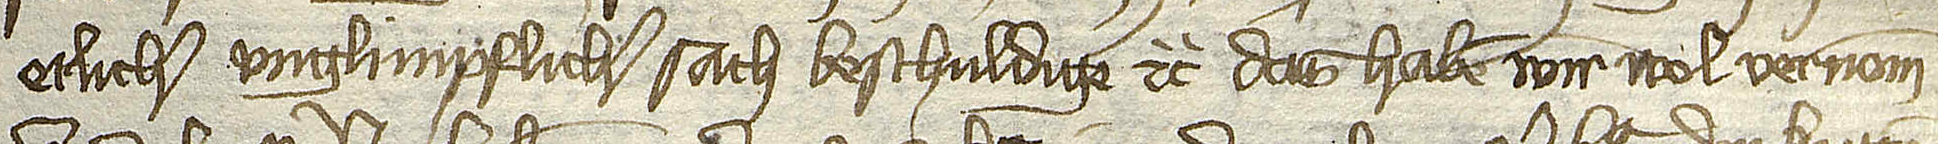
etlich* vnglimpflich* ſach beſchuldige ec* das habe* wir wol vernom*
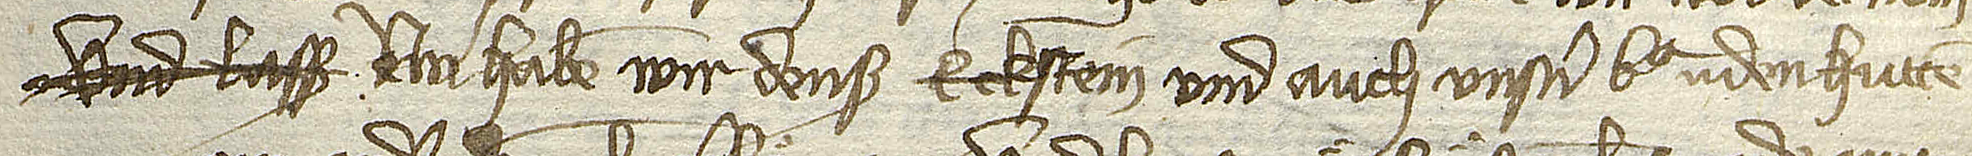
Vnd laſſ* Nu habe* wir denſ* Eckſtein vnd auch vnſ*n b* ~ den hutte*
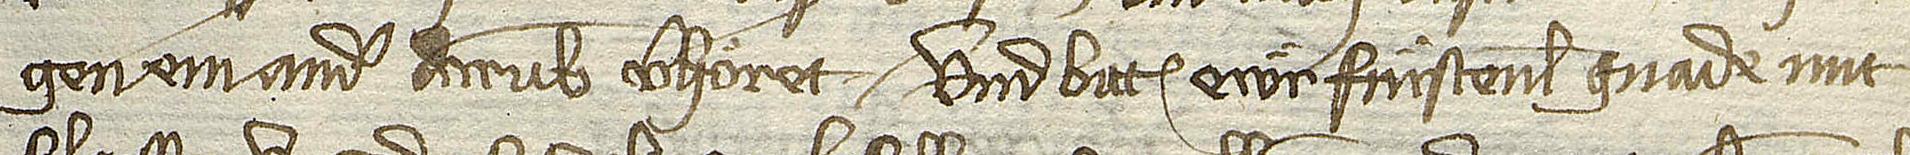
gen ein and* darub* v*höret / Vnd bitt* ewr fürſtenl* gnade mit
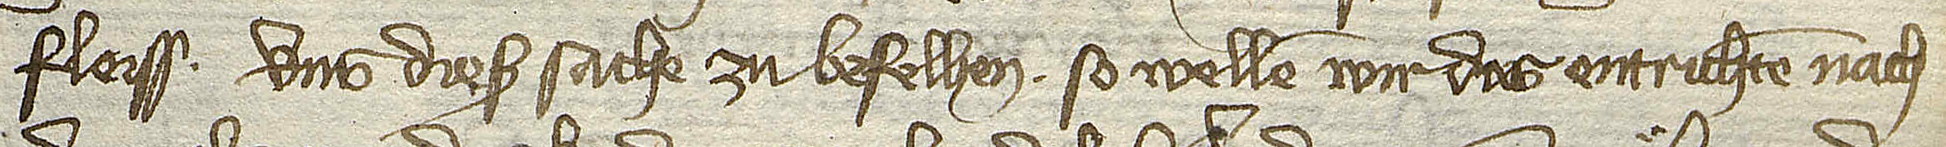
fleiſſ . Vns dieſ* ſache ʒu befelhen . ſo welle* wir das entrichte* nach
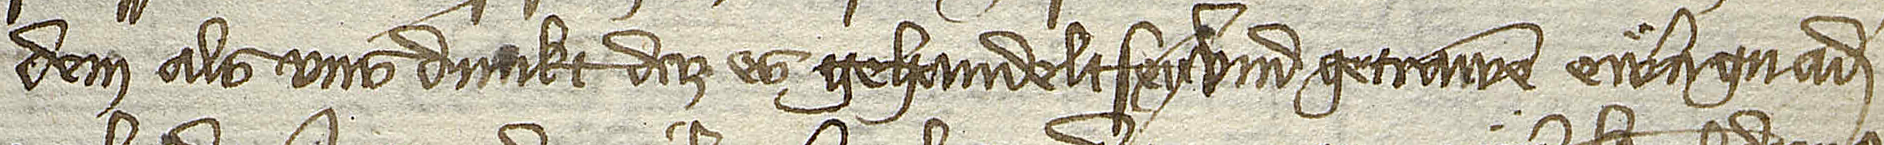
dem als vns dunkt daʒ es gehandelt ſey / Vnd getrawe* ew*n gnad*
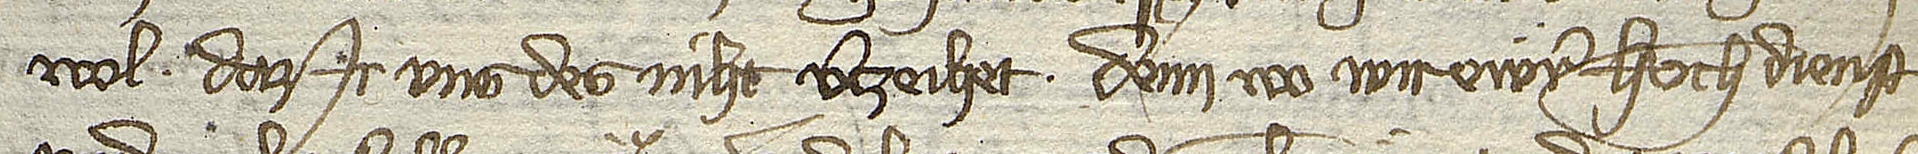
wol . daʒ Ir vns des niht v*cʒeihet . Denn wo wir ewr* hoch* dienſt
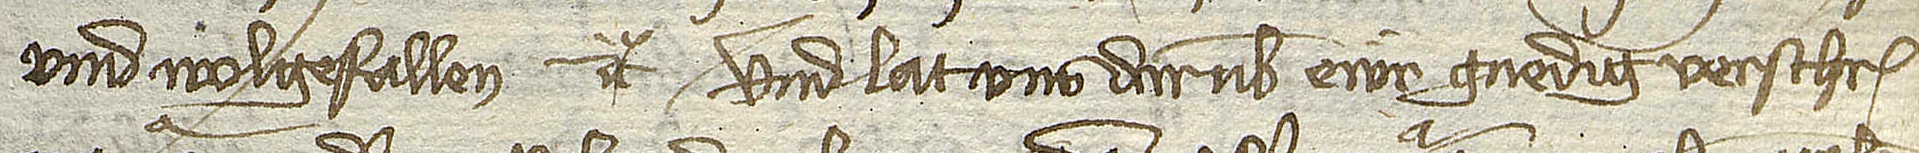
vnd wolgefallen ec* / Vnd lat vns darub* ewr* gnedig* verſchr*
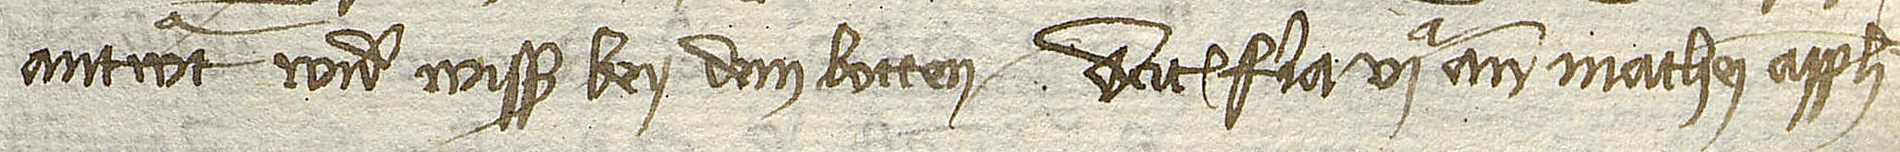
antw*t wid* wiſſ* bey dem botten / Dat* fia* vi* an* mathei appli*
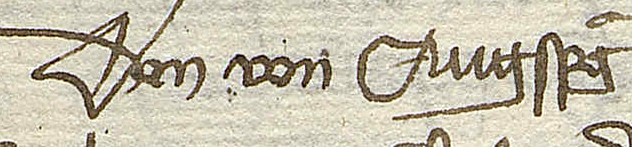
Den von Augſpg*
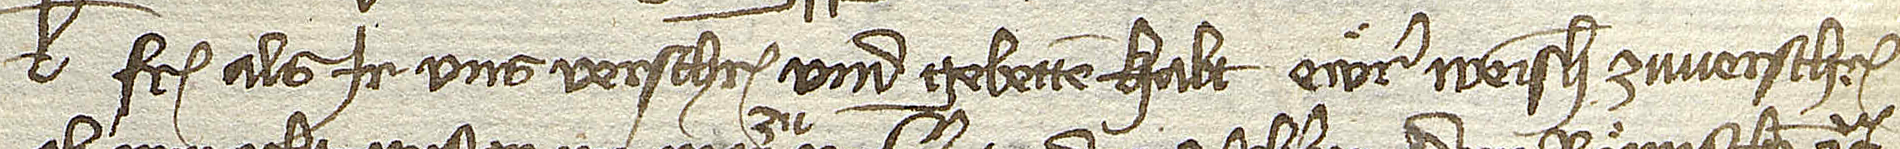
L* fr* als Ir vns verſchr* vnd gebette* habt ewr* weiſh* ʒuuerſchr*
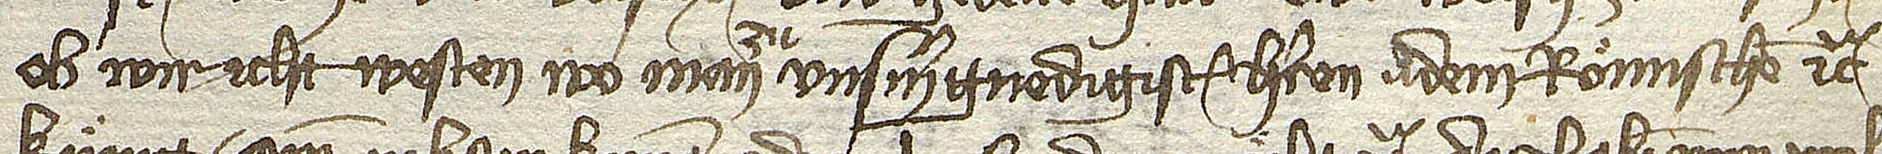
ob wir icht weſten wo man vnſ*m gnedigiſt* hren* ~dem Römiſche* ec*
